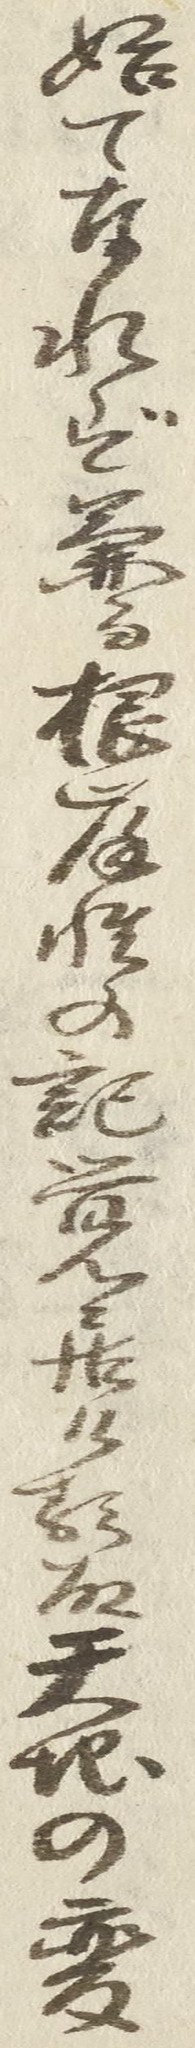始てなれば兼而根岸侯の記覚居ける故天地の変
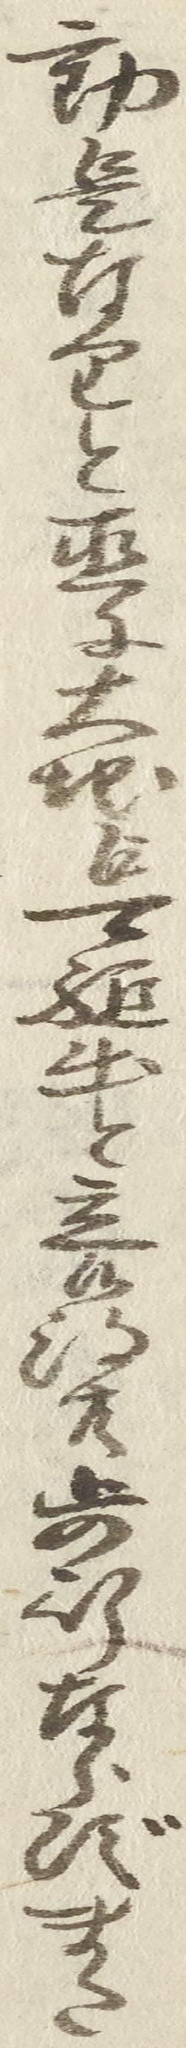動是なりと直に大地ゟ可駈出と立候得共歩行ならずまた
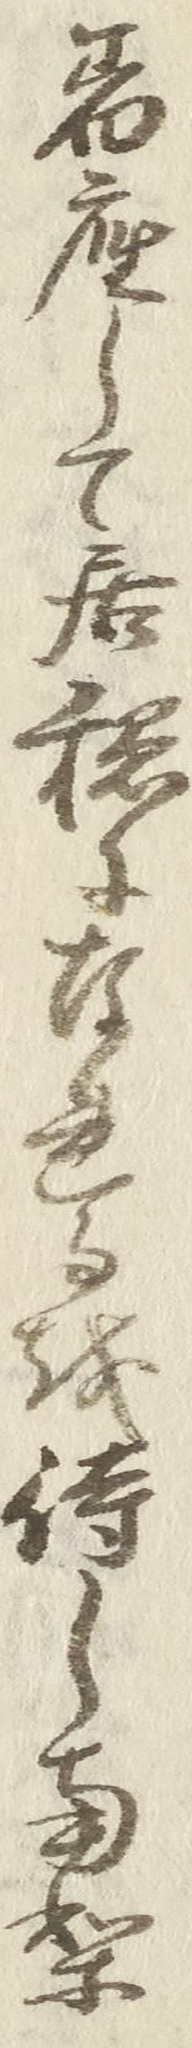着座して居穏になれるを待しなり
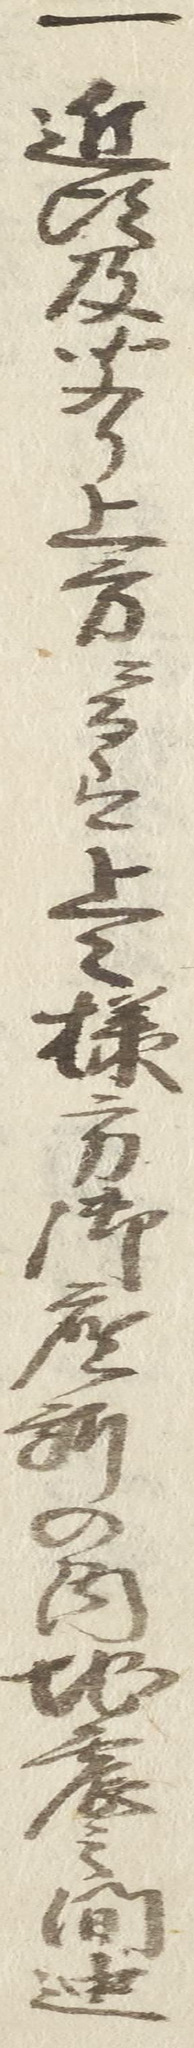一近頃及聞上方ニ而は上〻様方御座所の内地震之間迚
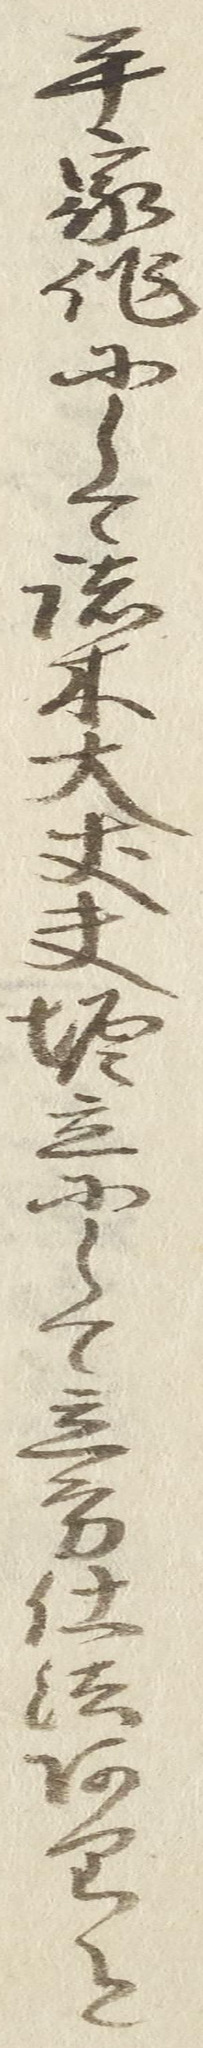平家作にして諸木大丈夫堀立にして立方仕法ありと
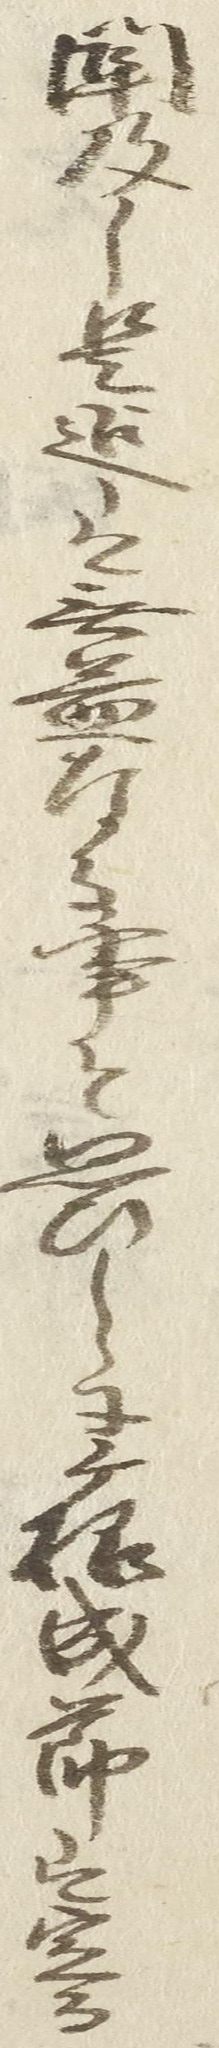聞及し是迄は無益なる事と思ひしにヶ様成節は定而
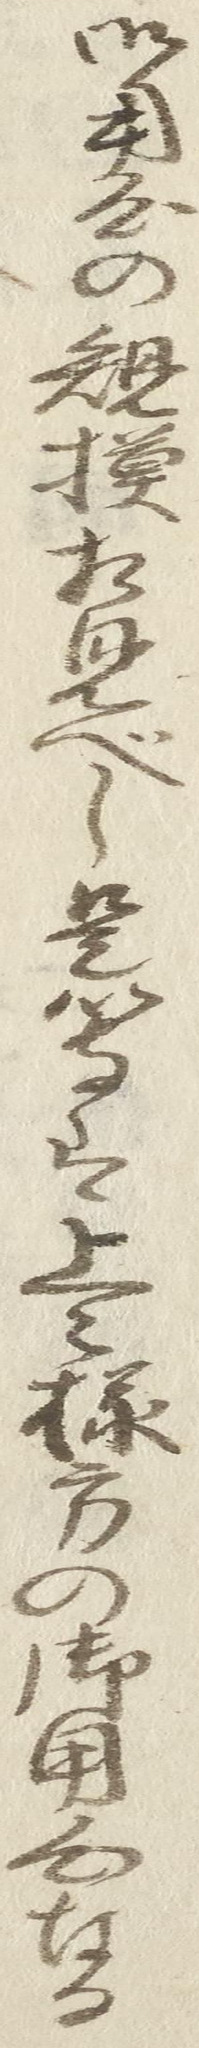御用心の規模相見べし是等は上〻様方の御用心なる
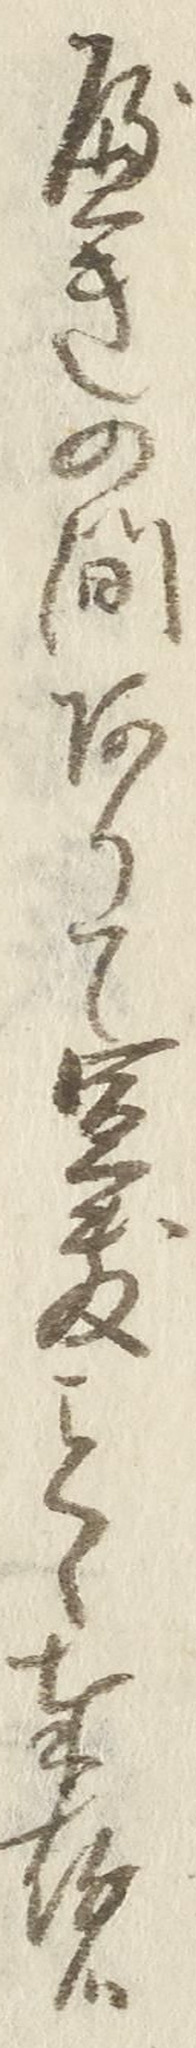べきの間ありて宜敷ことゝ奉存候

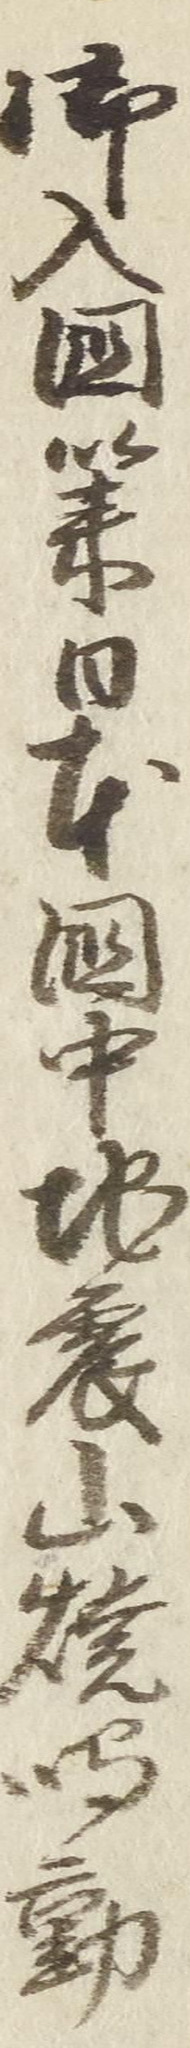御入国以来日本国中地震山焼鳴動
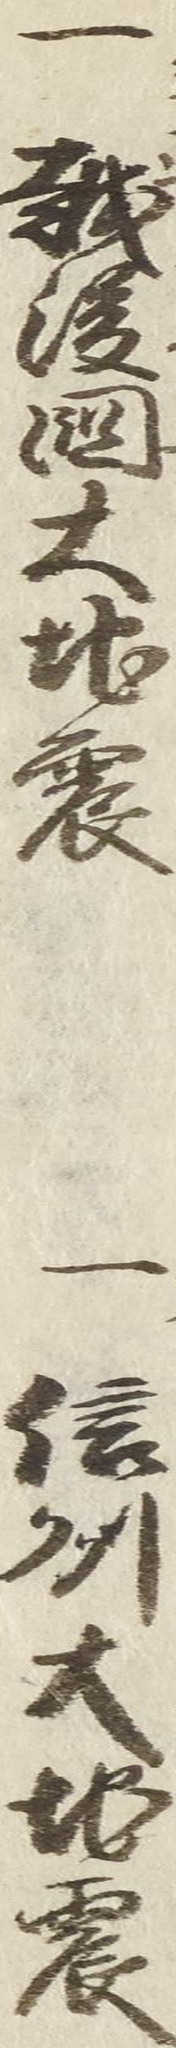一越後国大地震一信州大地震
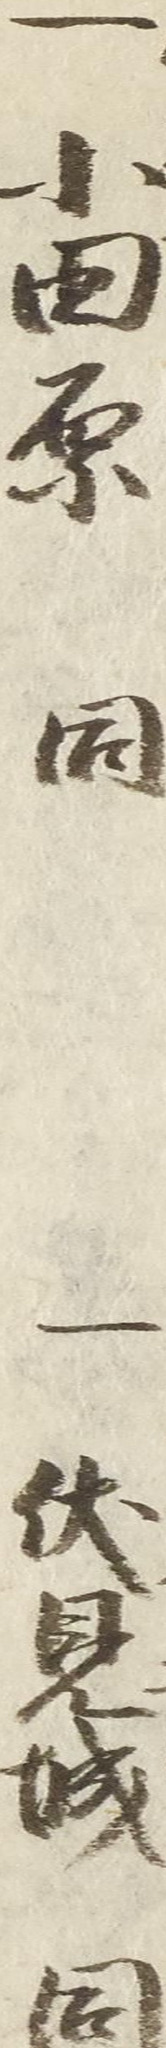一小田原同一伏見城同
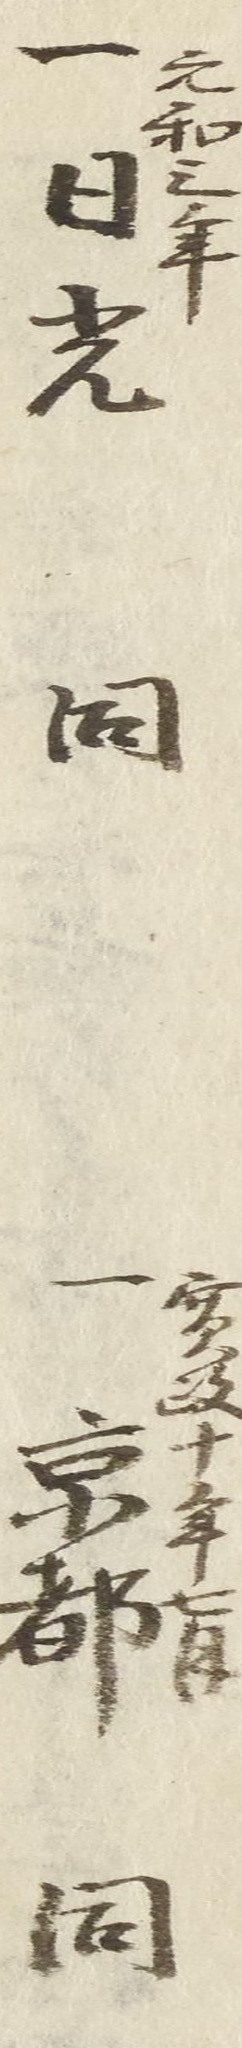一日光同一京都同
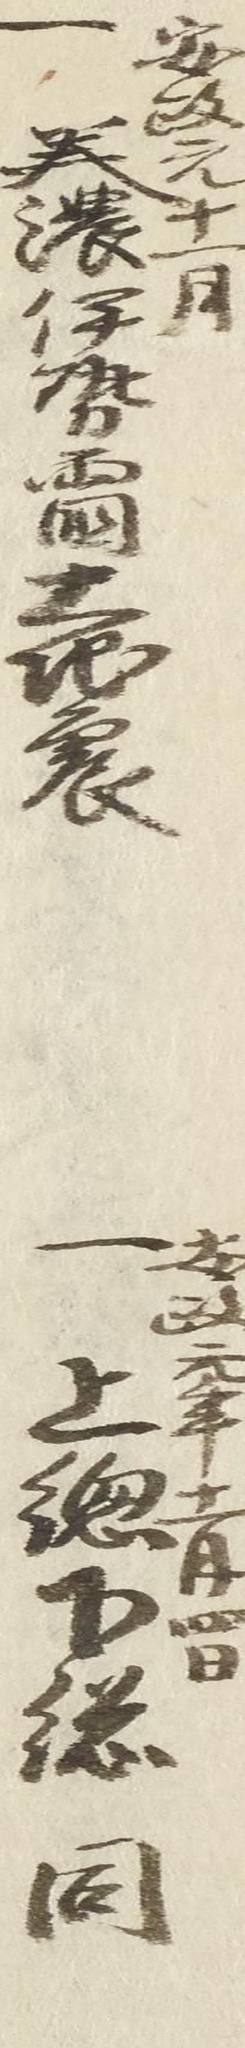一美濃伊勢西国大地震一上総下総同
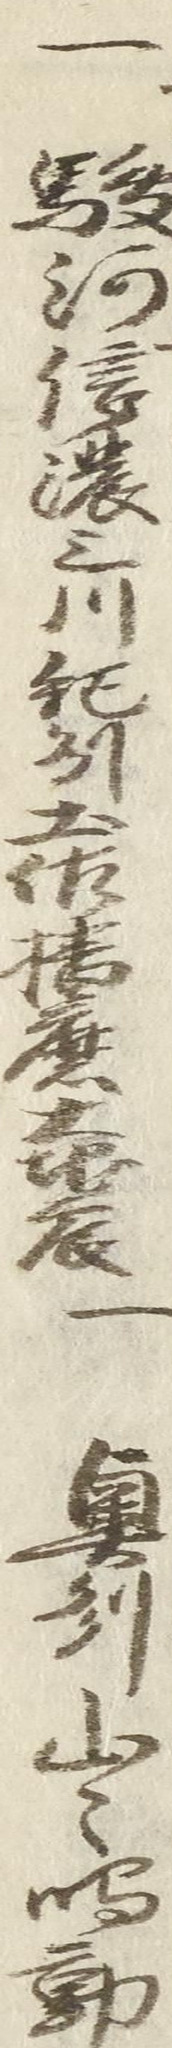一駿河信濃三河紀州土佐播磨大地震一奥州山々鳴動
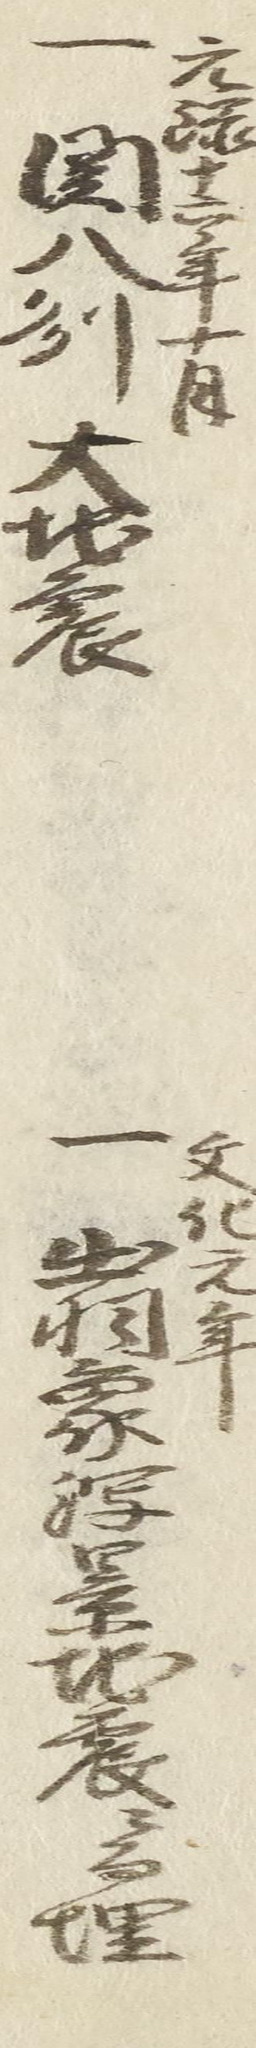一関八洲大地震一出羽象潟景地震二而埋
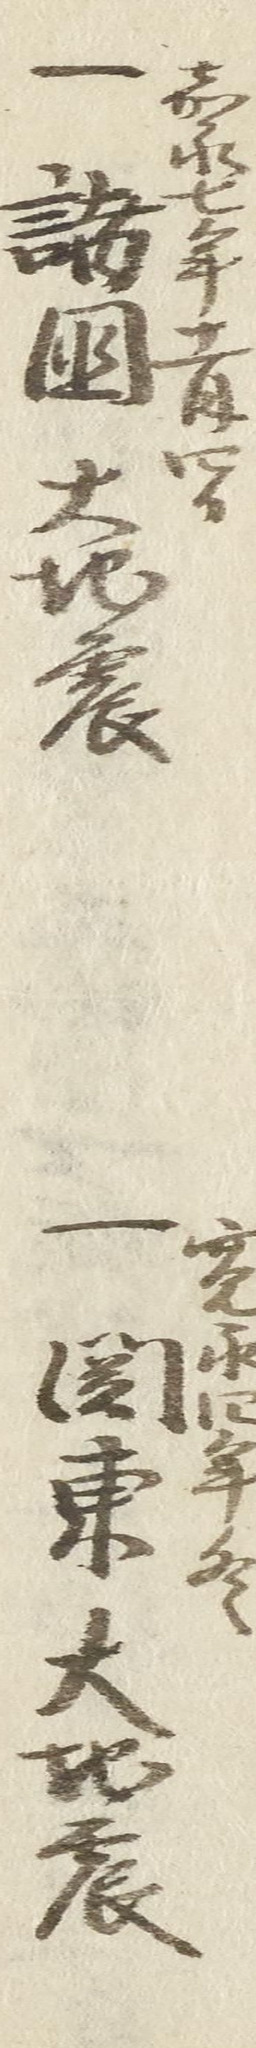一諸国大地震一関東大地震
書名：従往古地震御届書記誌之一
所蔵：東京大学地震研究所図書室 Earthquake Research Institute Library, The University of Tokyo, JAPAN
